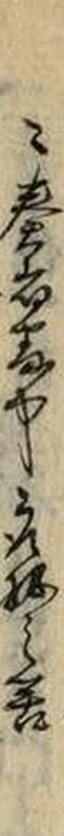々奏者番中取扱之筈
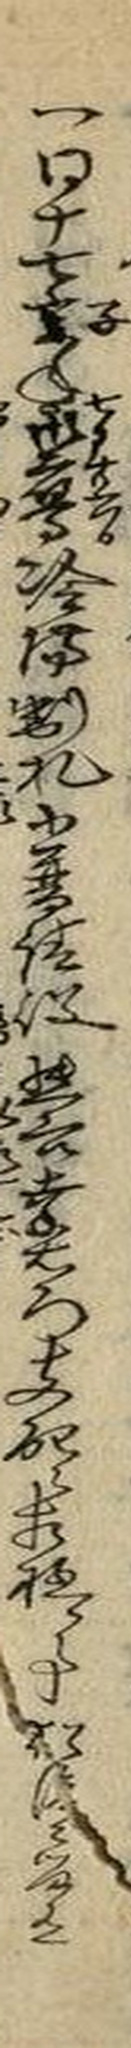一同十七子年◦七月廿六日御鷹冷場制札小普請役熊谷幸右衛門支配に相極候事猶後に留有
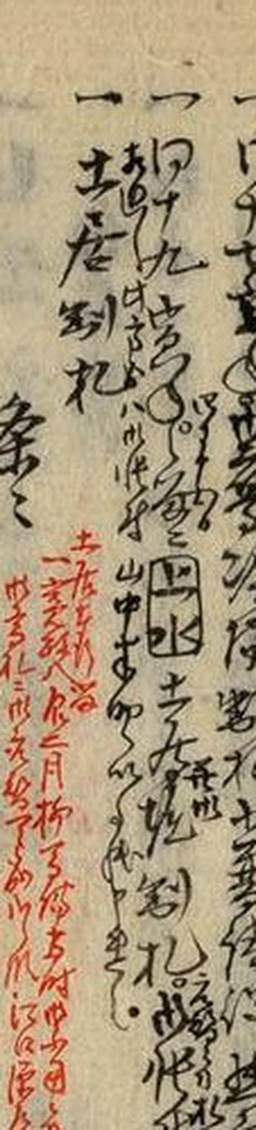相廻し此方ゟは御帳付山中半助へ以手紙申遣之
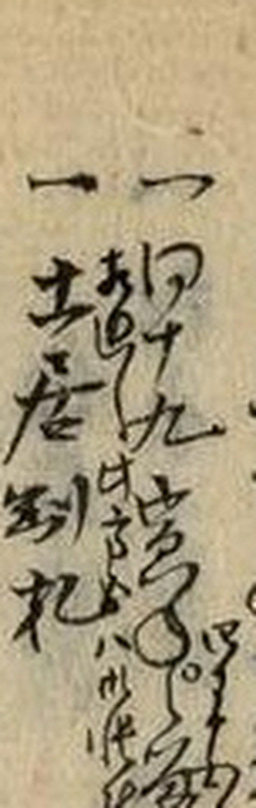一土居制札
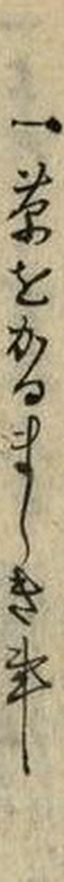一草をかるましき事
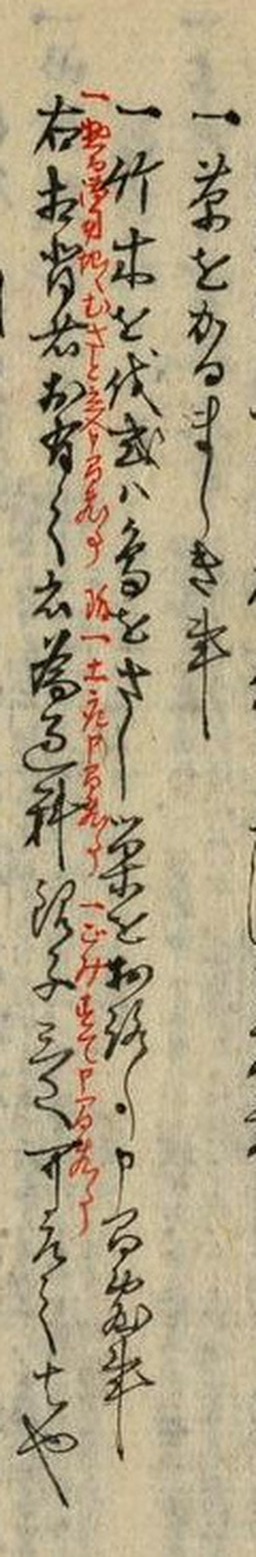一竹木を伐或は鳥をさし巣をおろし申間敷事
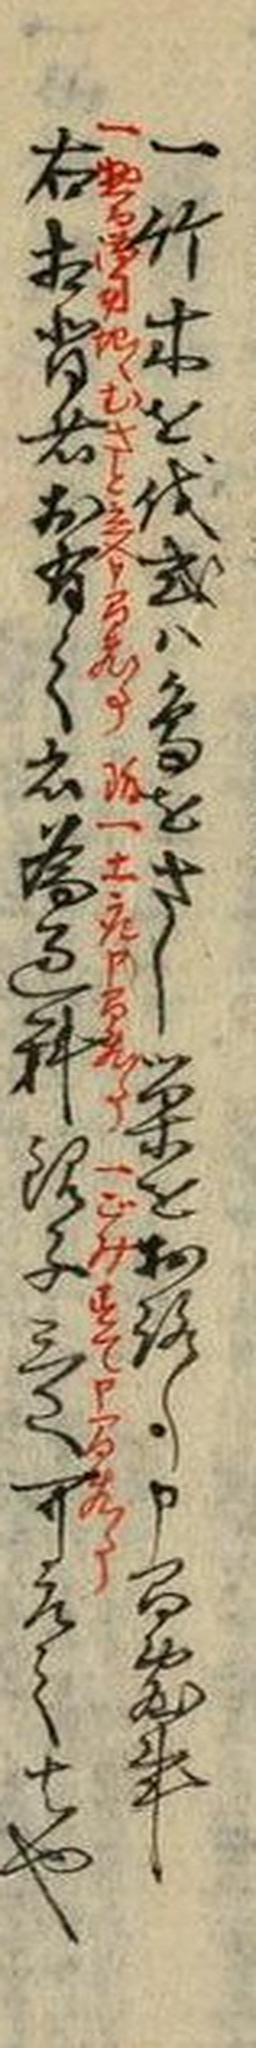右相背者於有之者為過料銀子三匁可取之者也
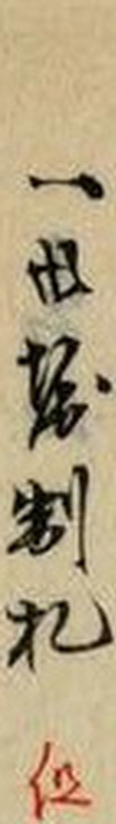一土居制札
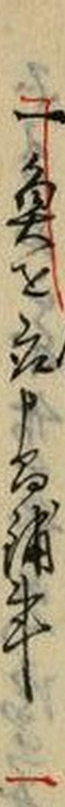一雪割込申間鋪事
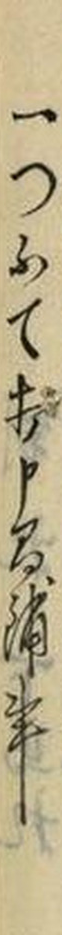一つふて打申間鋪事
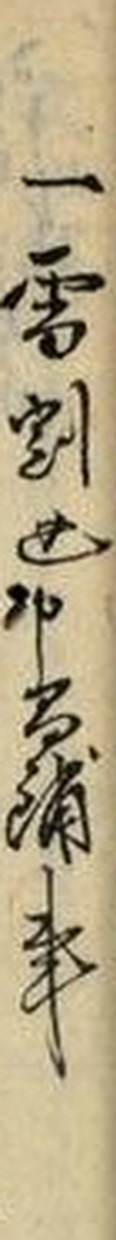一雪割込申間鋪事
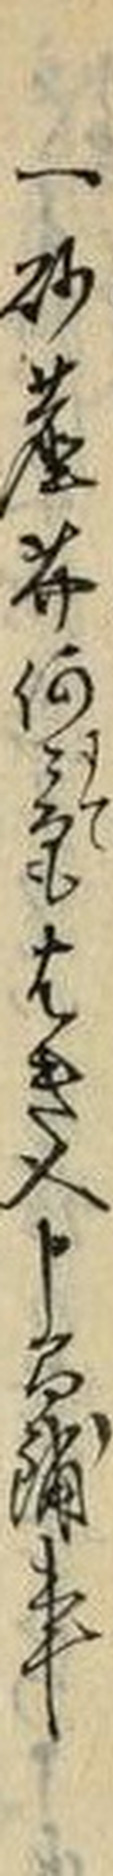一砂塵芥何にてもはき入申間鋪事
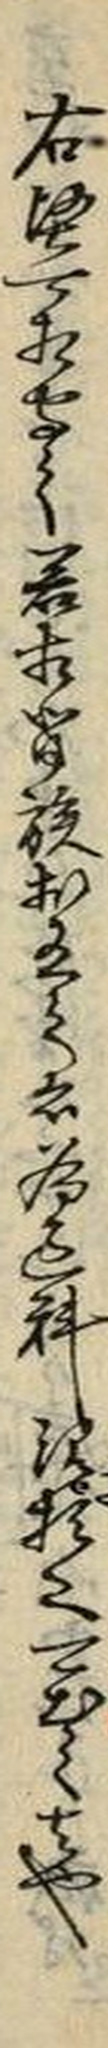右堅可相守之若相背族於有之者為過料銀子拾匁可取之者也
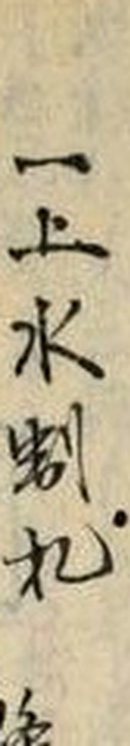一上水制札
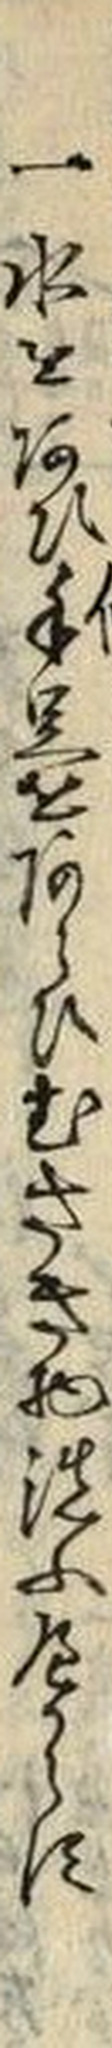一水をあひ手足をあらひむさき物洗ふへからす
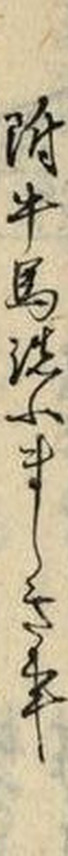附牛馬洗ふましき事
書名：御城下諸事之部
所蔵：福井県文書館 Fukui Prefectural Archives
